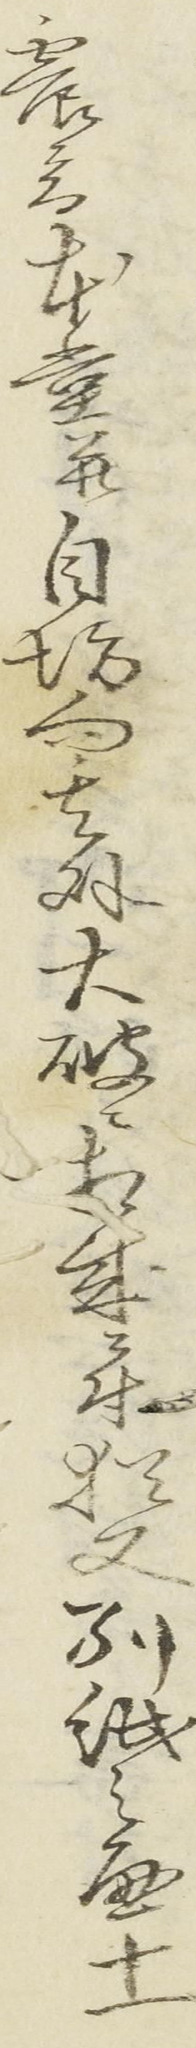震ニ而本堂幷自坊向其外大破ニ相成ニ付猶又別紙之通十一
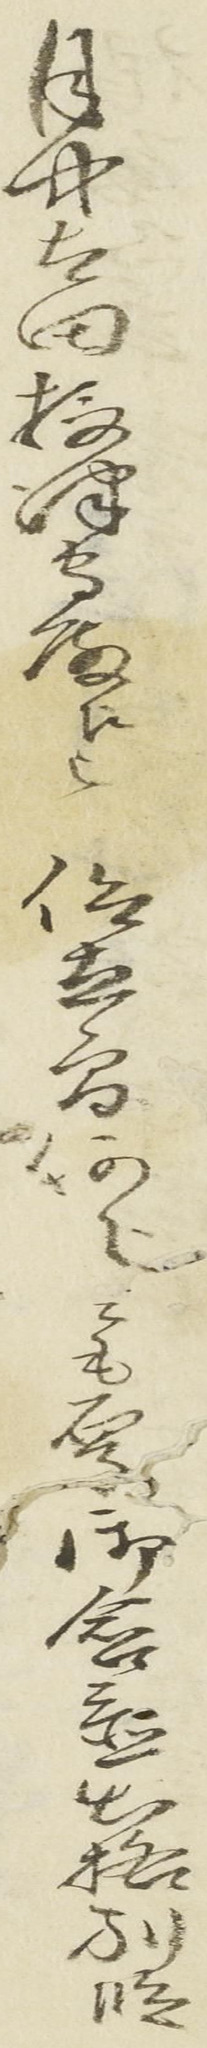月中太田摂津守殿え被仰立候間何分ニも厚御含置出格別段
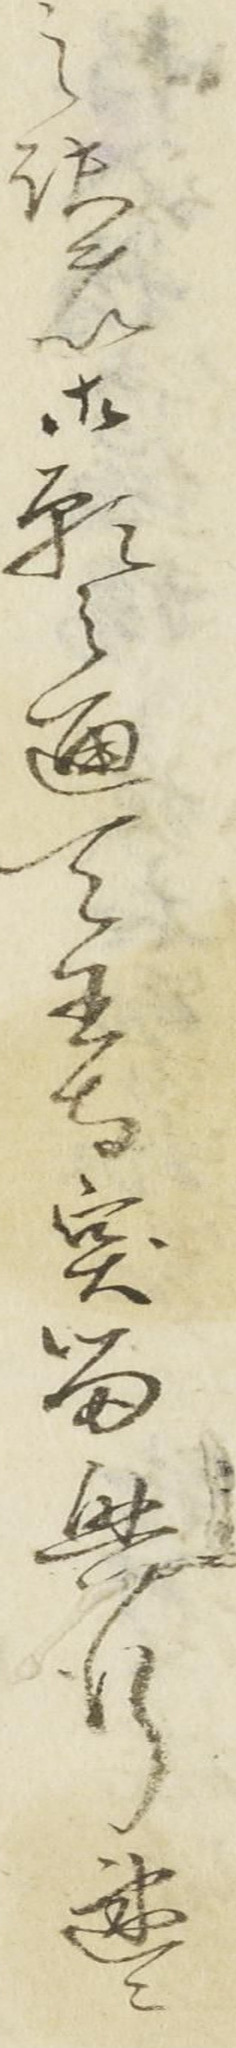之訳ヲ以御願之通天王寺突留興行速ニ
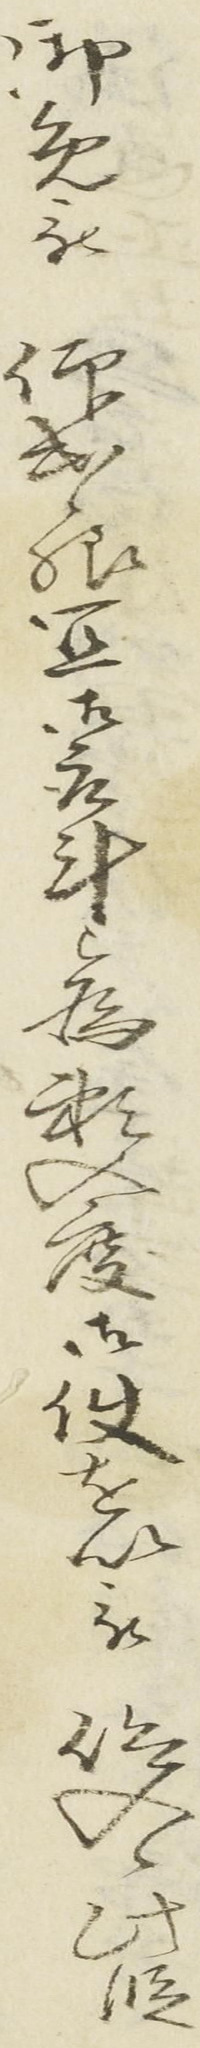御免被仰出候様宜御取斗被為頼入度御使を以被仰入候此段
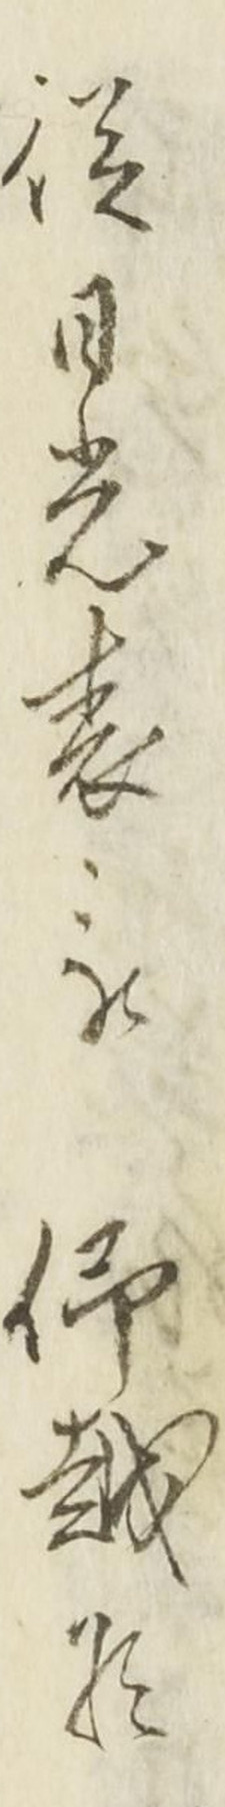従日光表被仰越候
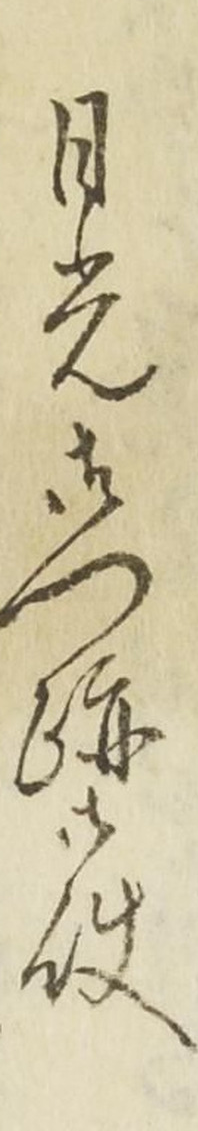日光御門跡御使
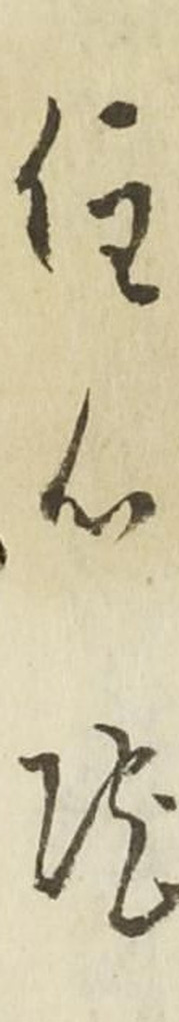住心院
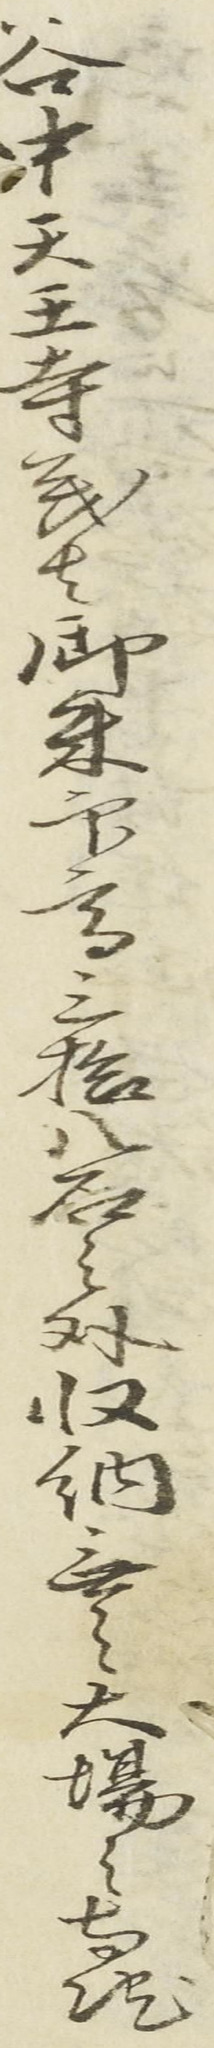谷中天王寺義は御朱印高三拾八石之外収納無之大場之寺院
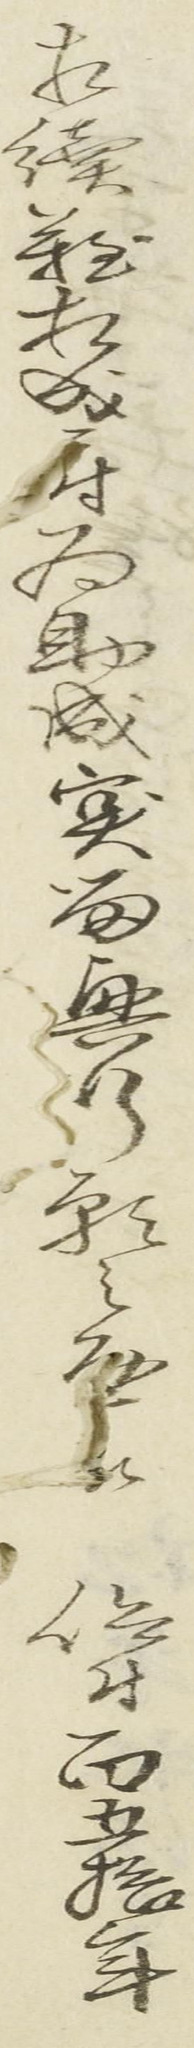相続難相成ニ付為助成突留興行願之通被仰付百五拾年
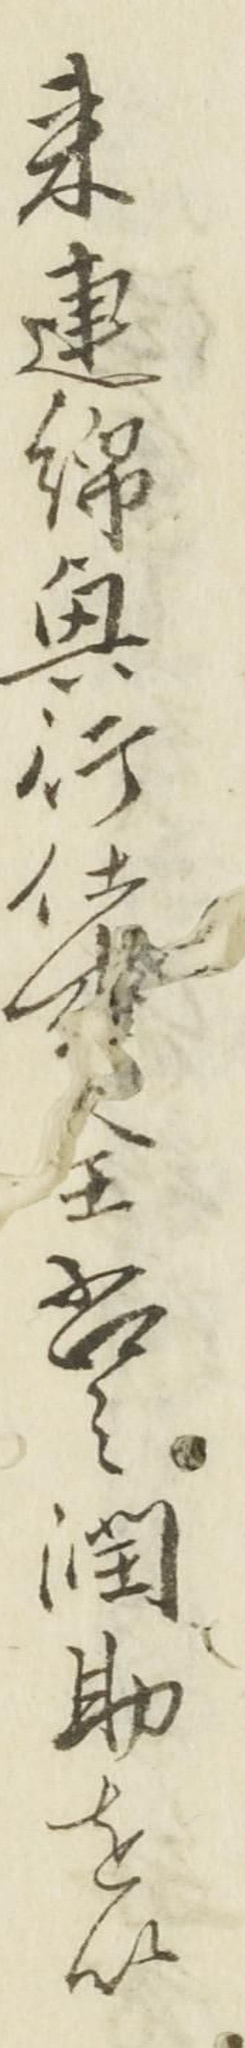来連綿興行仕来全右之潤助を以
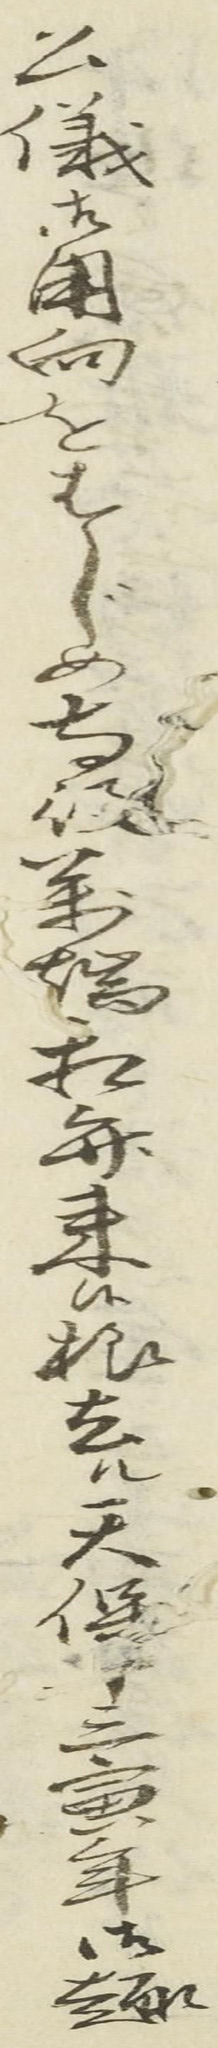公儀御用向をはじめ寺役万端相弁来候様去ル天保十三寅年御趣
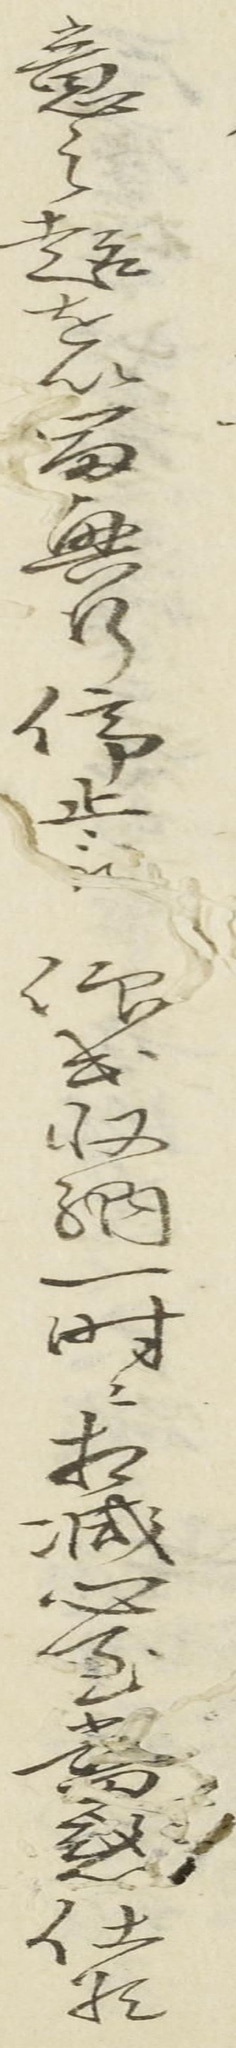意之趣を以富興行停止ニ被仰出収納一時ニ相減必至当惑仕候
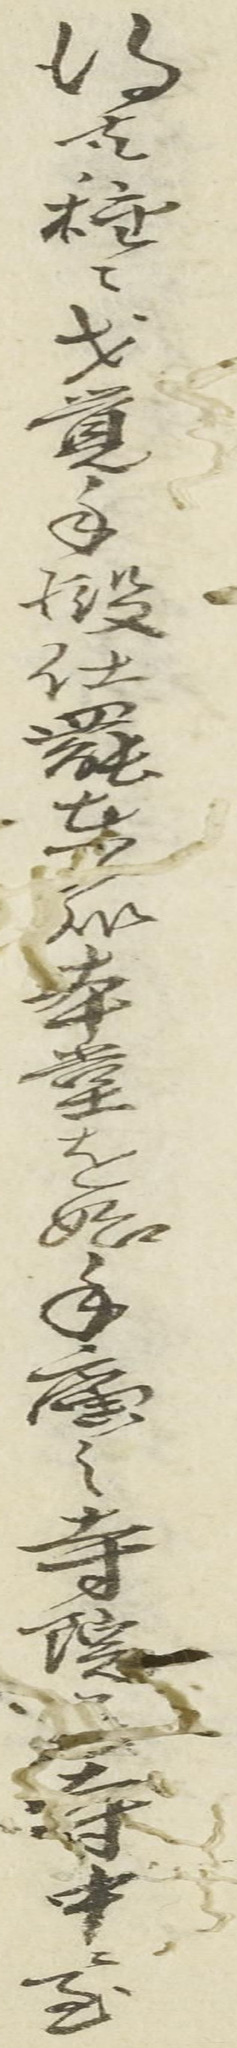得共種々才覚手段仕罷在候処本堂を始手広之寺院及寺中ニ至
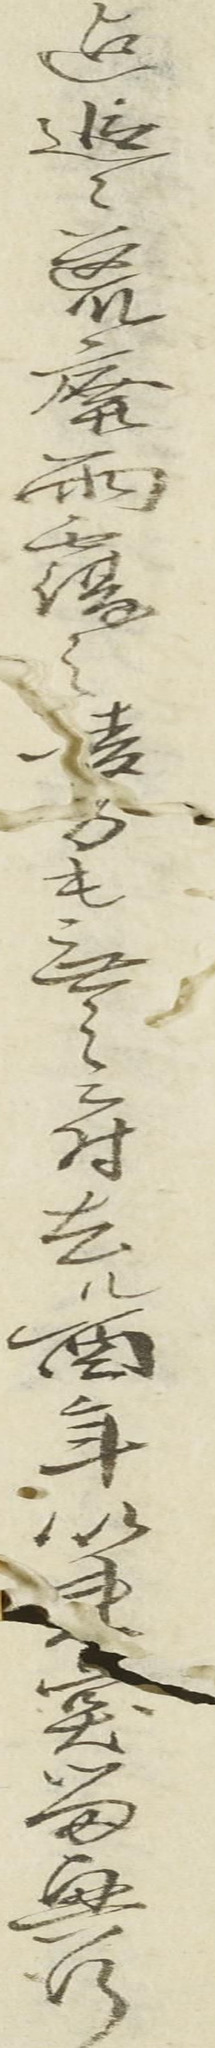迄追々荒廃雨覆之凌分も無之ニ付去ル酉年以来突留興行
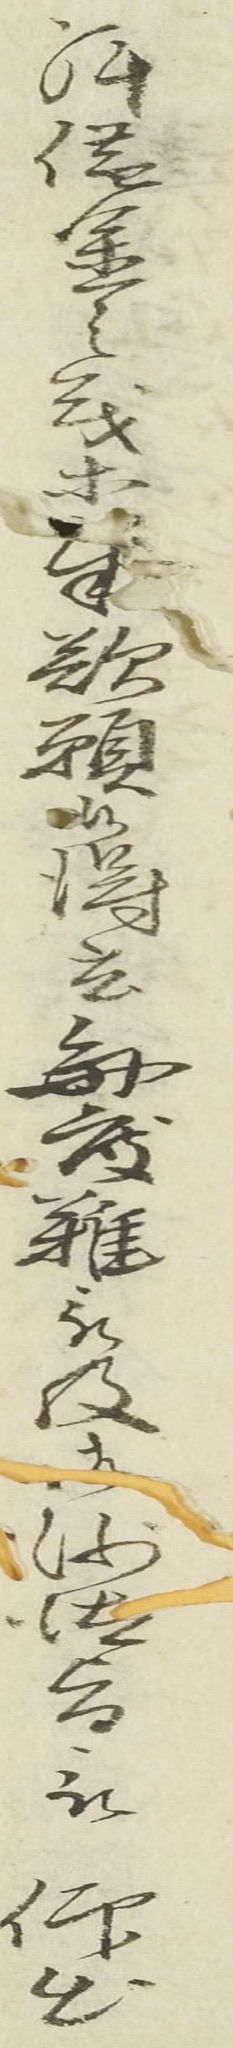拝借金之義等奉歎願候得共毎度難被及御沙汰旨被仰出
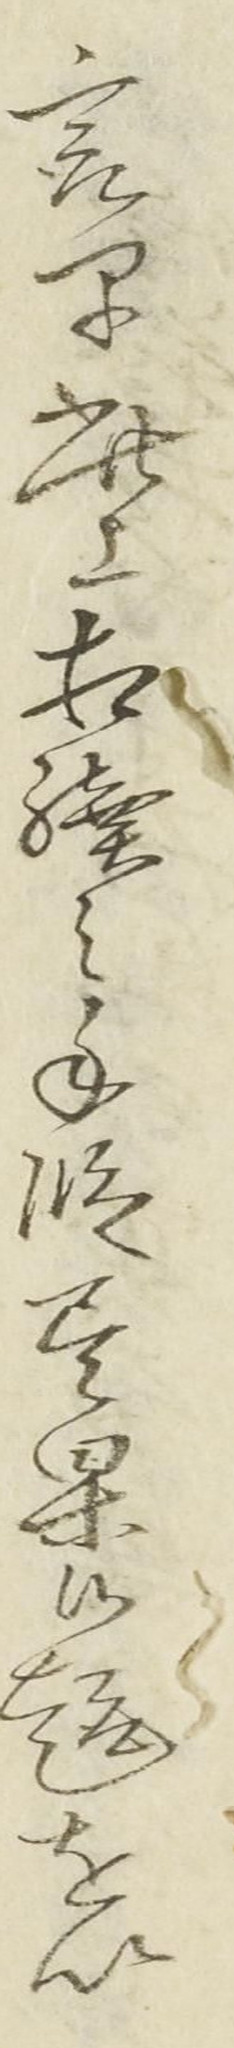最早此上相続之手段尽果候趣を以
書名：安政二乙卯年十月二日大地震之事
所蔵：東京大学地震研究所図書室 Earthquake Research Institute Library, The University of Tokyo, JAPAN
